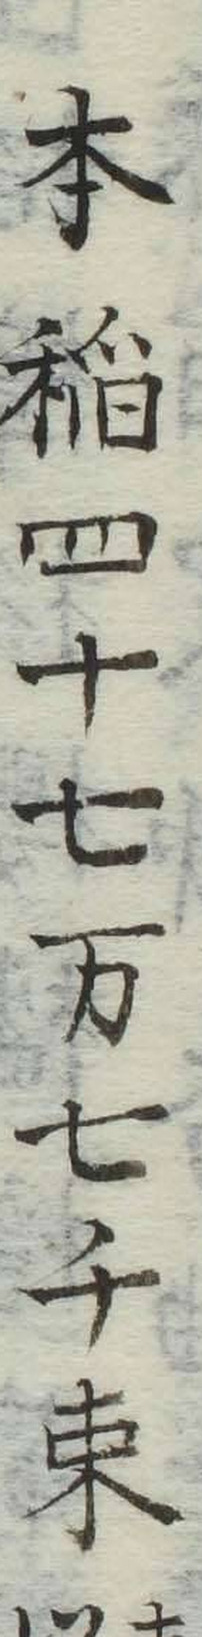本稲四十七万七千束
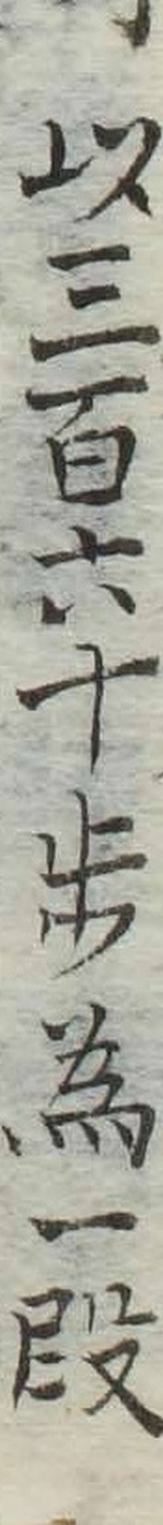以三百六十歩為一段
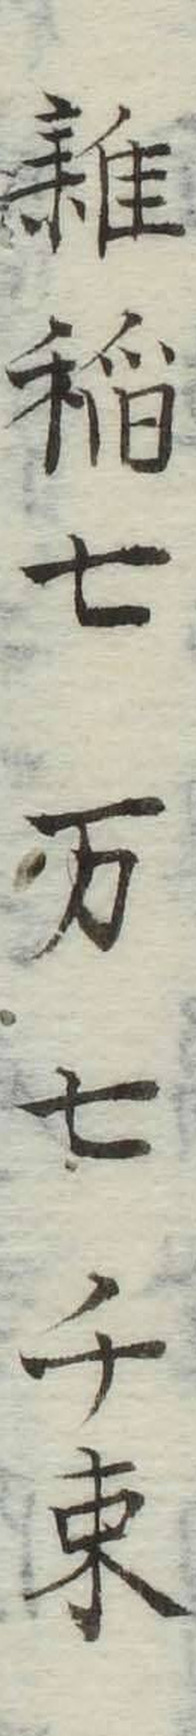雜稲七万七千束
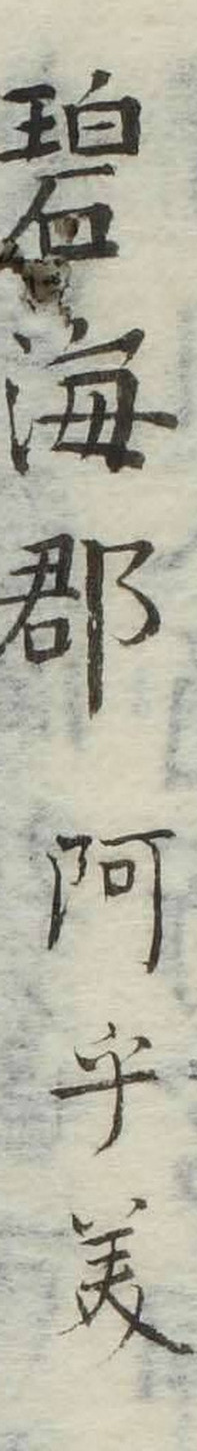碧海郡阿乎美
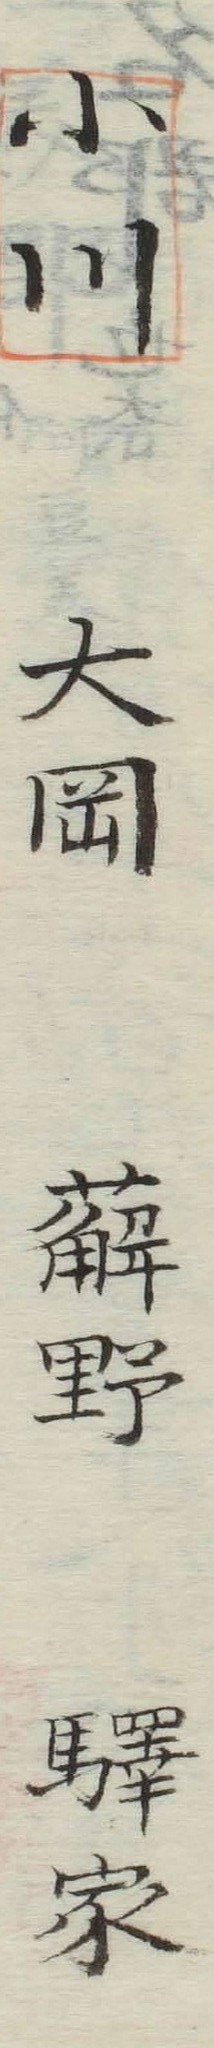小川大岡薢野驛家
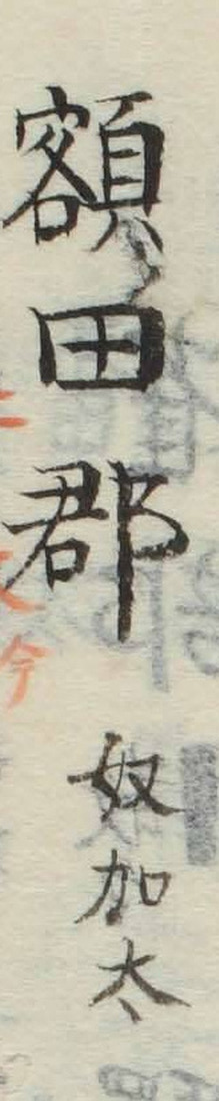額田郡奴加太
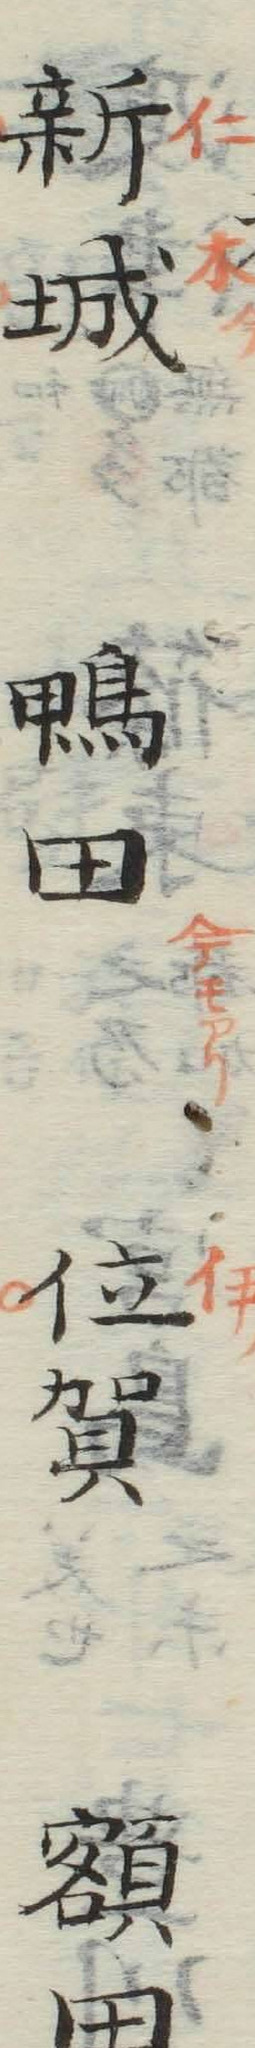新城鴨田位賀額田
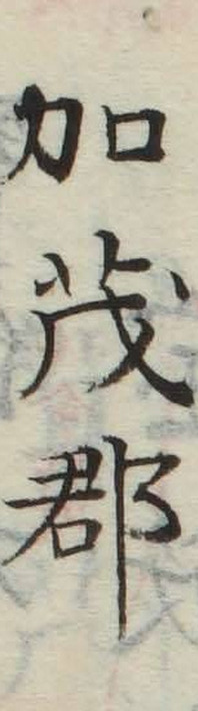加茂郡
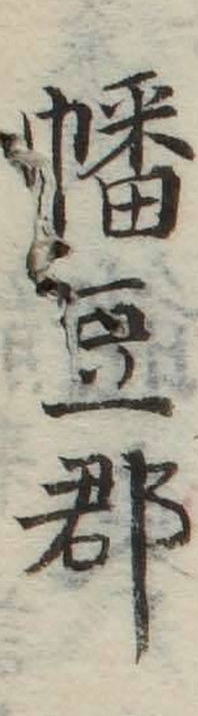幡豆郡

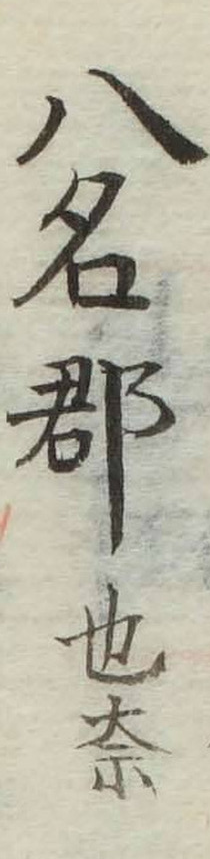八名郡也奈
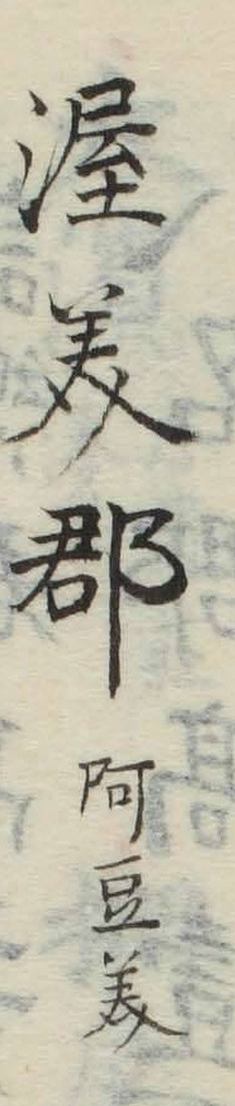渥美郡阿豆美
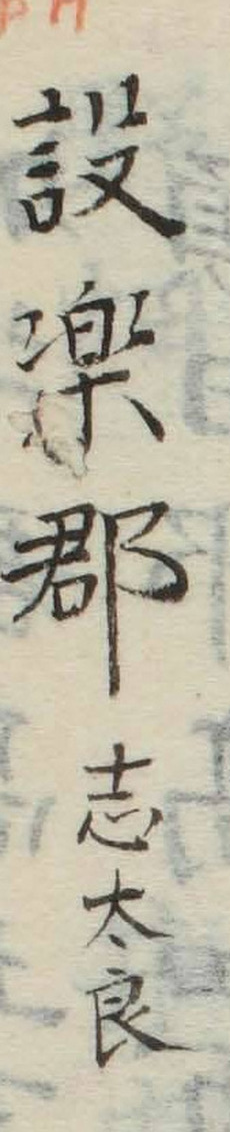設楽郡志太良

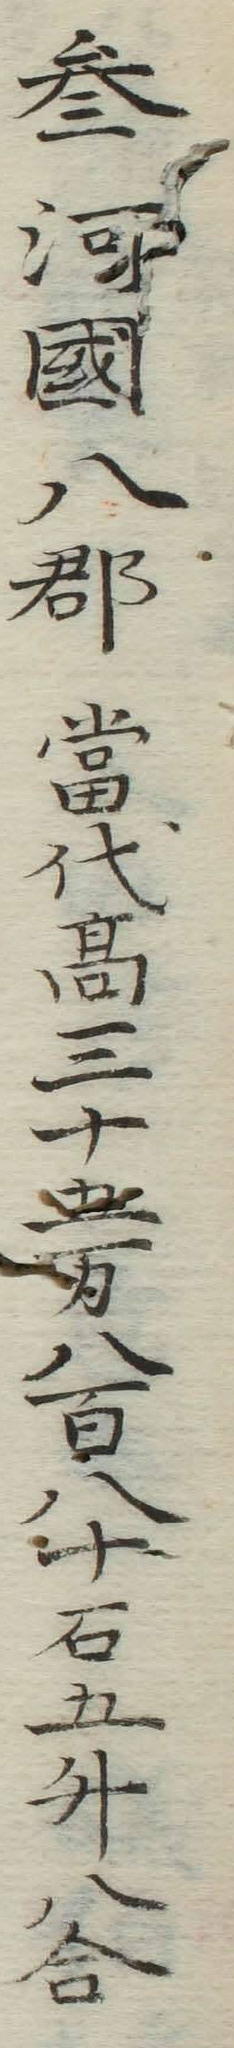参河國八郡當代髙三十五万八百八十石五升八合
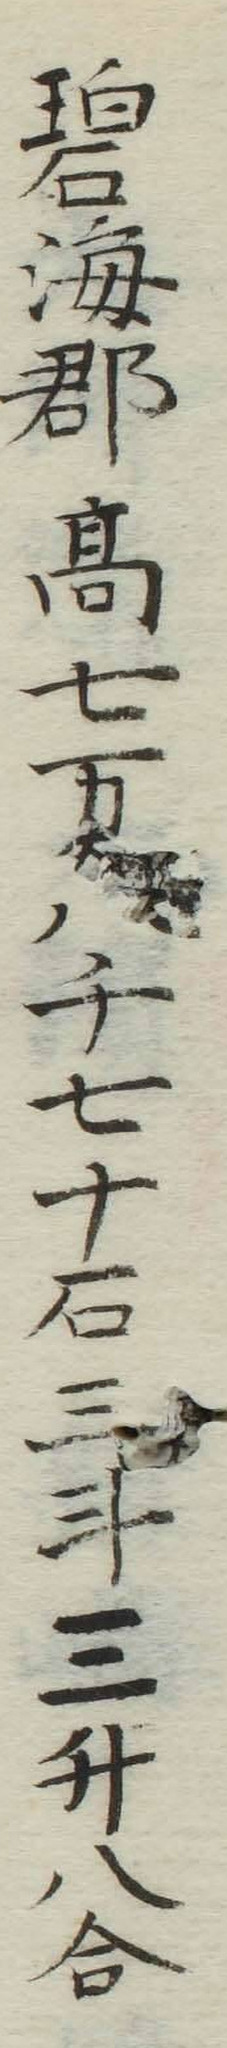碧海郡髙七万八千七十石三斗三升八合
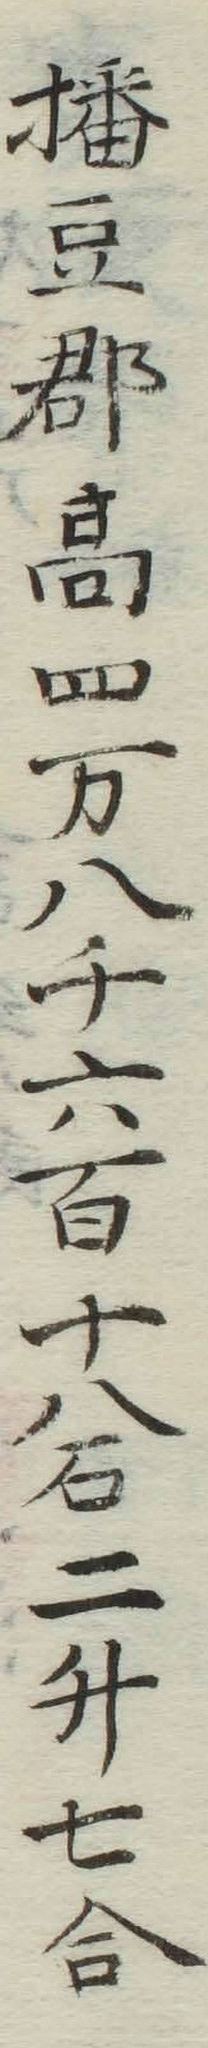播豆郡髙四万八千六十八石二升七合
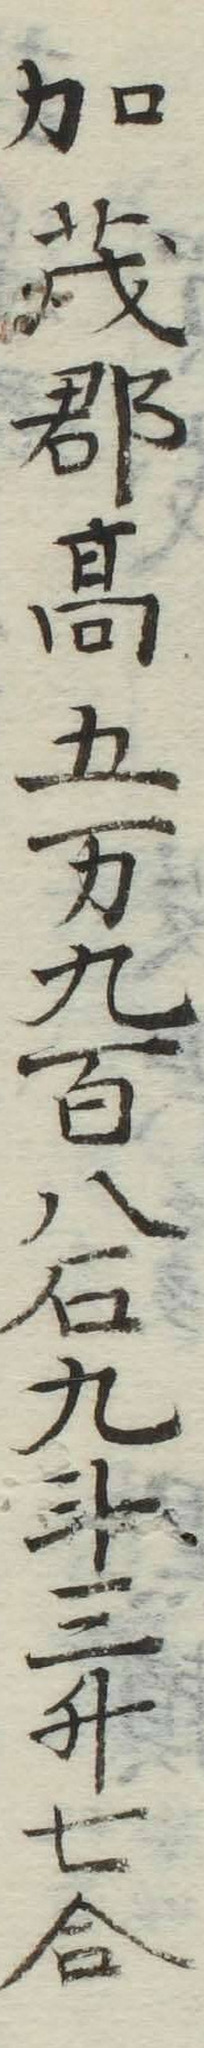加茂郡髙五万九百八石九斗三升七合
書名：三河国二葉松
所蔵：国文学研究資料館
